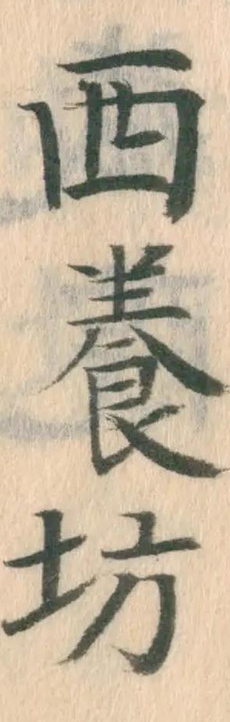西養坊

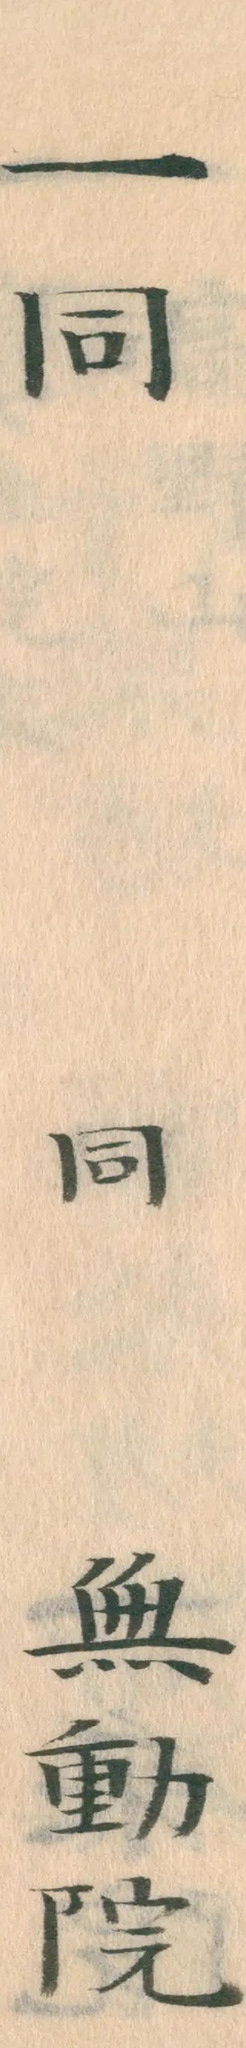一同同魚動院
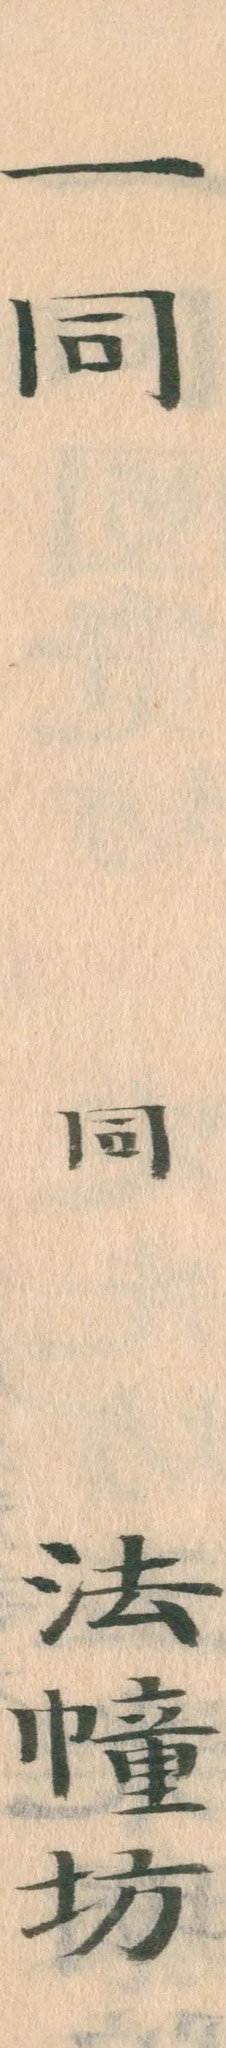一同同法幢幢坊
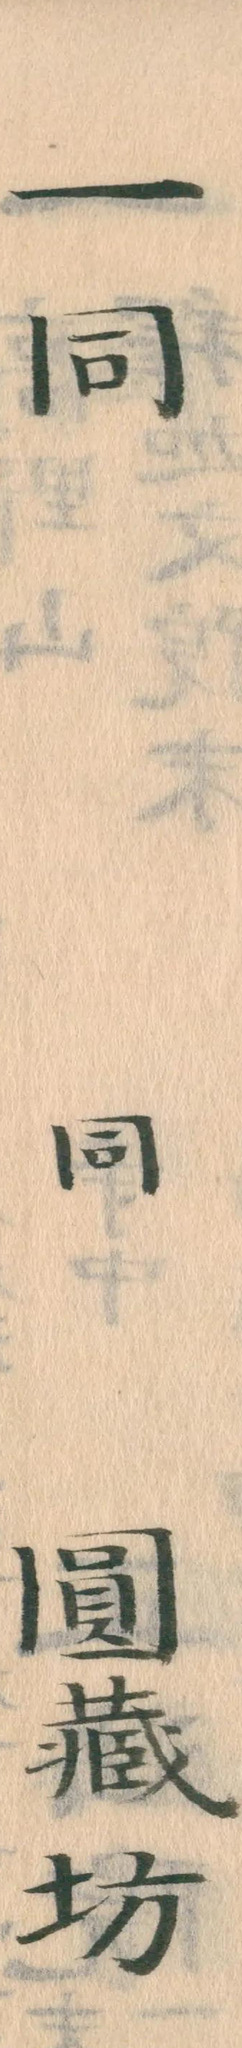一同同圓蔵坊
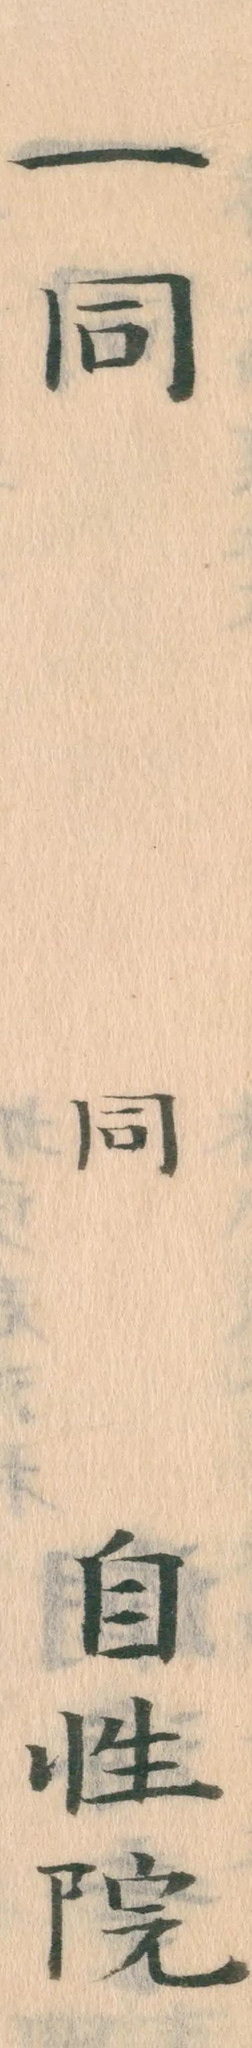一同同自性院
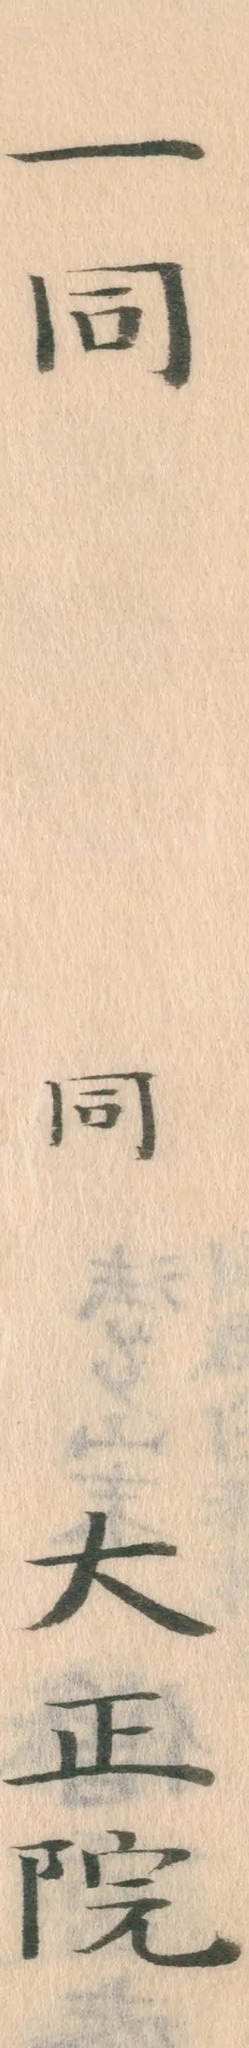一同同大正院
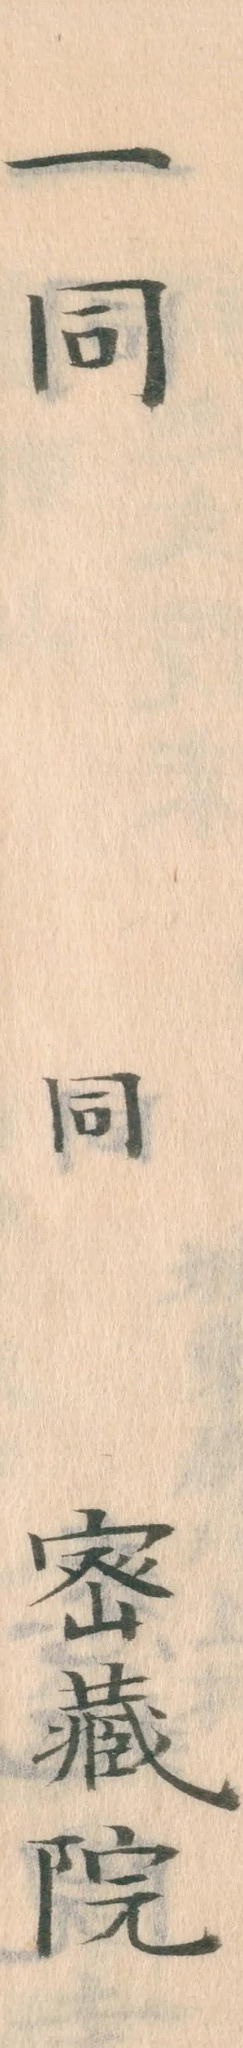一同同密蔵院
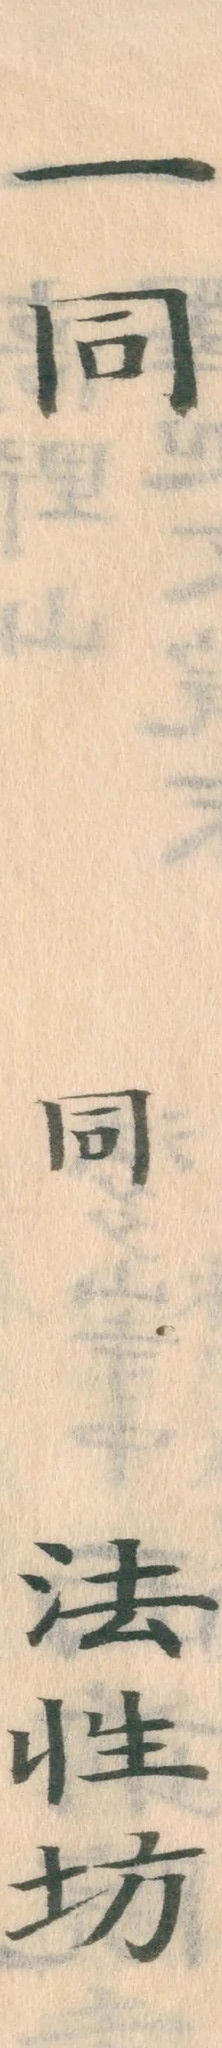一同同法性坊

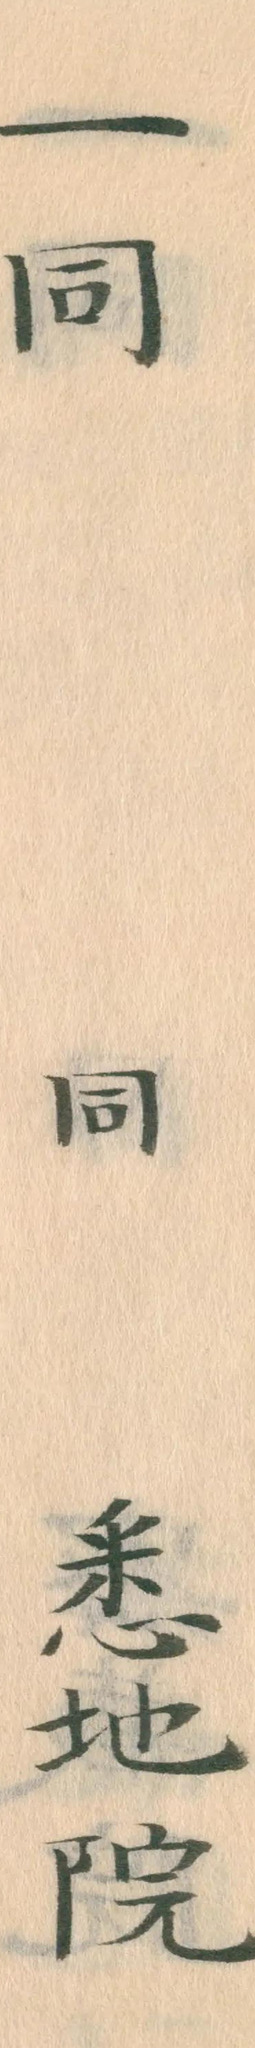一同同悉地院
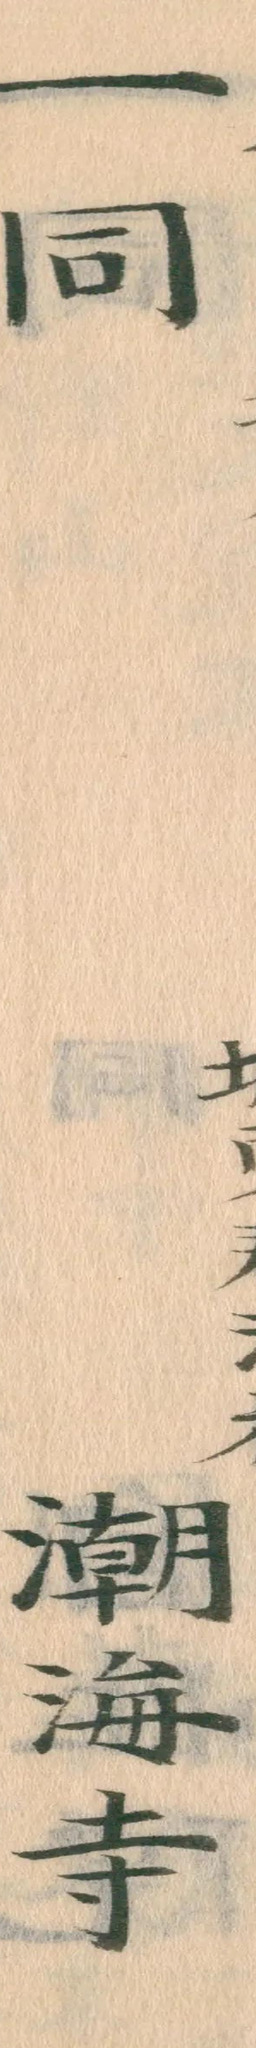一同潮海寺
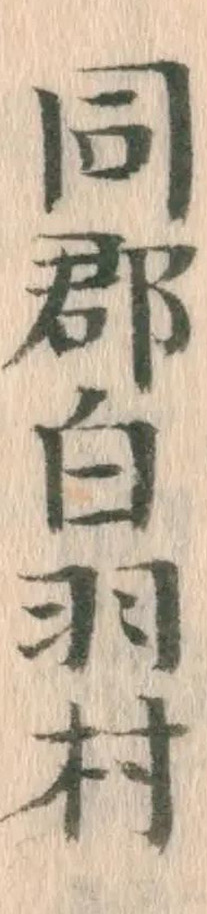同郡白羽村
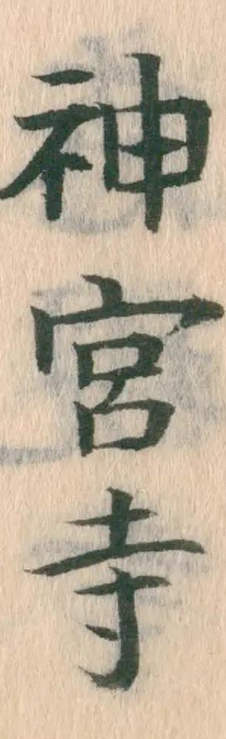神宮寺
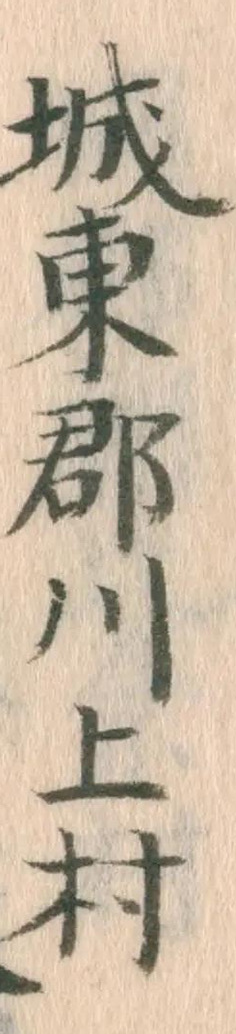城東郡川上村
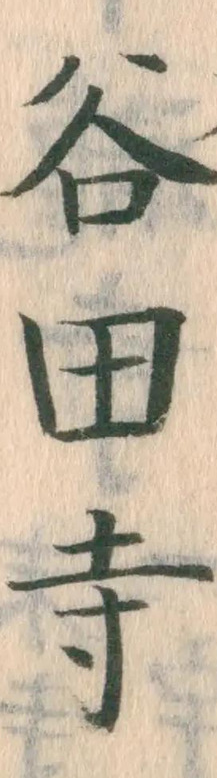谷田寺
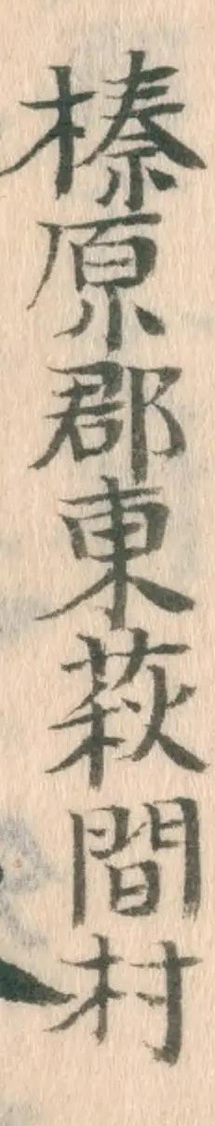榛原郡東萩間村
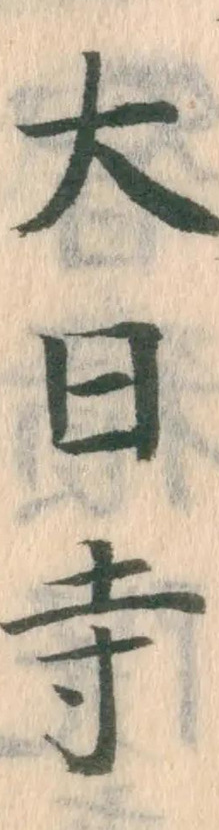大日寺
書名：古義真言宗本末帳 21巻. [4] 第三 伊賀国、伊勢国、志摩国、尾張国、三河国、遠江国、駿河国、伊豆国、甲斐国
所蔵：国立国会図書館 National Diet Library, JAPAN
